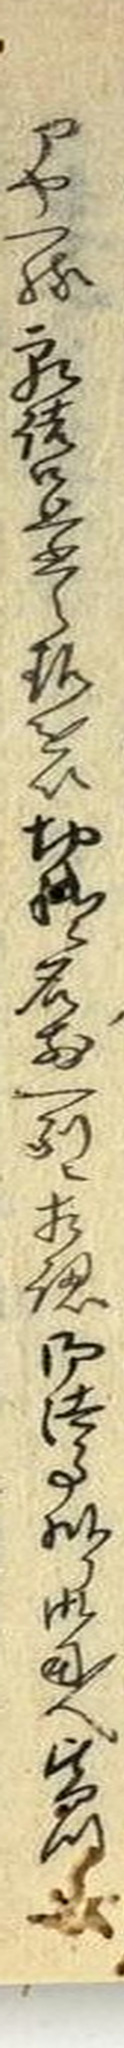部や一統願詰口上書之趣を以切紙ニ名前一列ニ相認御法事掛り御用人皆川
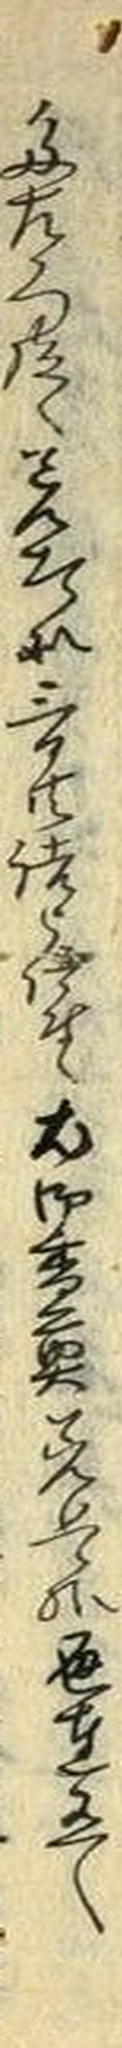多左衛門殿へ差出候処三日共詰被仰付候尤御香典差上候様通達有之
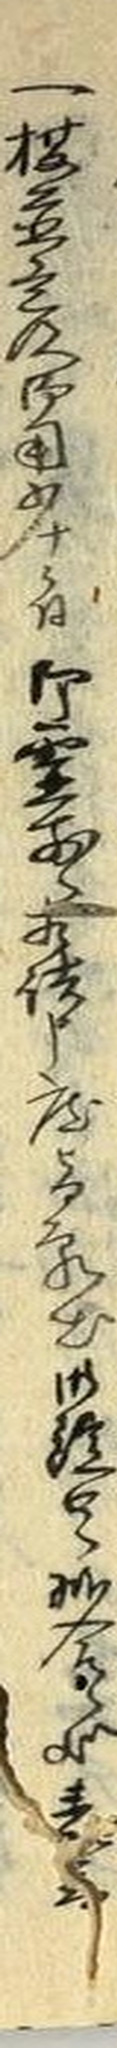一榎並玄沢御用少ナニ付御霊前ニ相詰申度旨願出御錠口へ掛合候処表ニ而
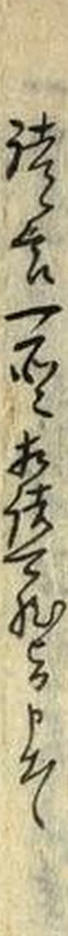詰候節一所ニ相詰可然旨申出候
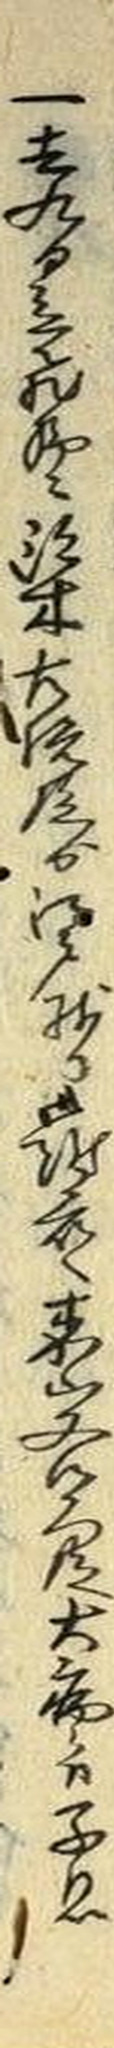一去九日立飛脚ニ鈴木左膳殿ゟ江戸残り御附衆へ森山又左衛門殿大病ニ付子息
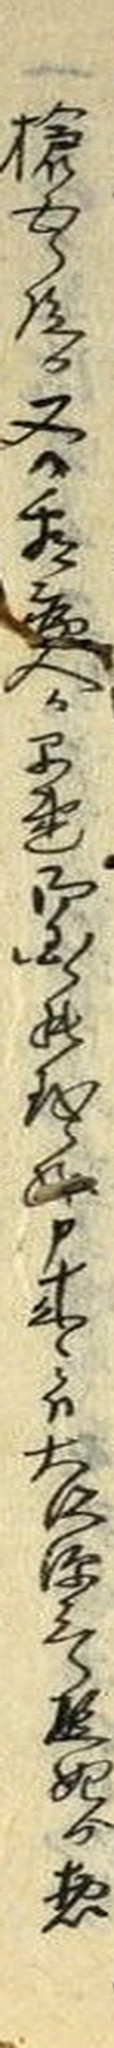槍五郎殿か又ハ看病人か早速御国へ罷越候様申来候ニ付大沢源三郎殿始ゟ惣
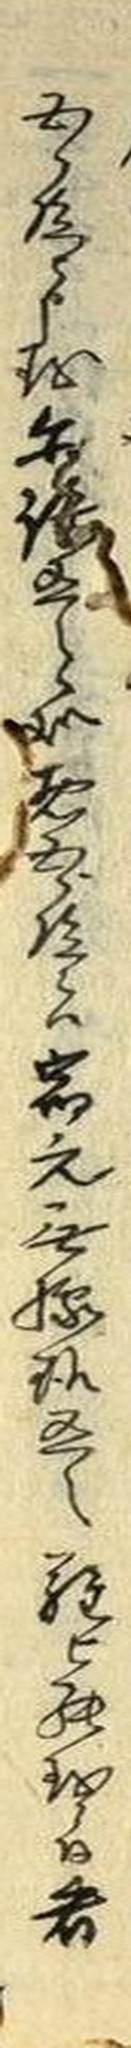五郎殿被申越示談有之候処惣五郎殿ニハ宿元無拠趣有之難被罷越ニ付看
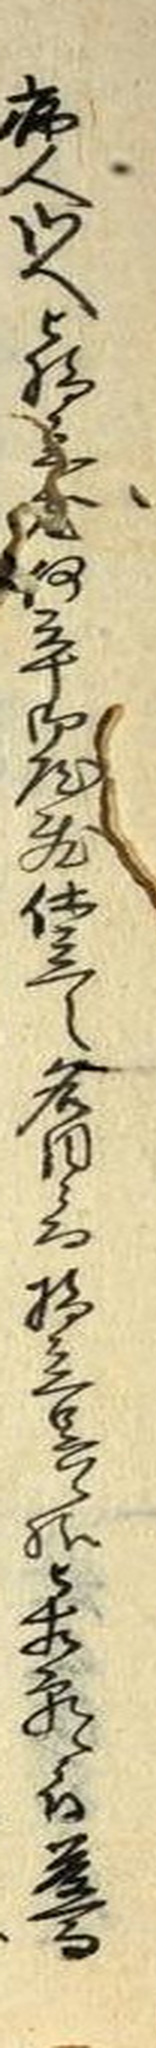病人弐人被指立度何卒御屋敷仕立之名目ニ而指立呉候様被相願候ニ付藤馬
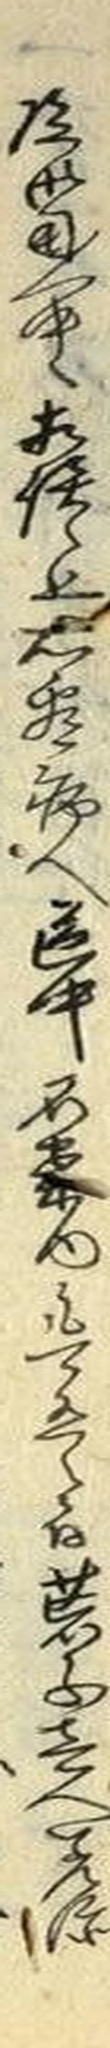殿御用人中へ相談之上右看病人道中不案内ニも可有之候ニ付荒子壱人差添
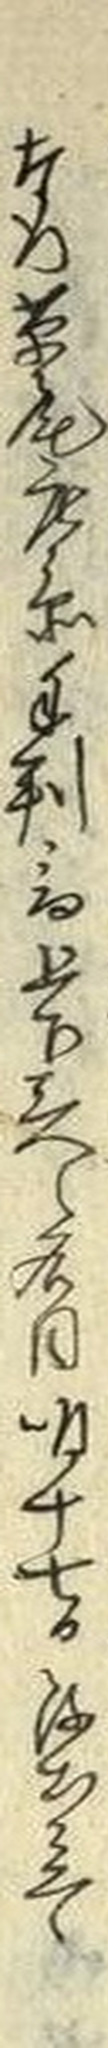奉行草尾庄兵衛手判ニ而上下三人之名目明十七日致出立候
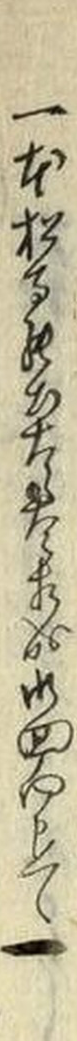一本松寺罷出大奥ニ相成御回向申上候
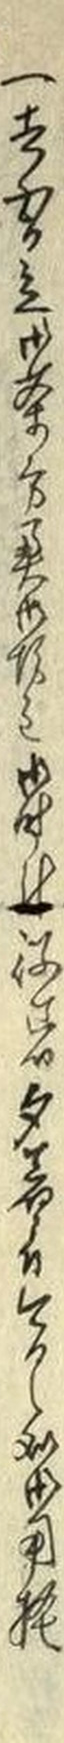一去五日立御茶方奥御坊主御時計役着夕着ニ付今日之処御用捨
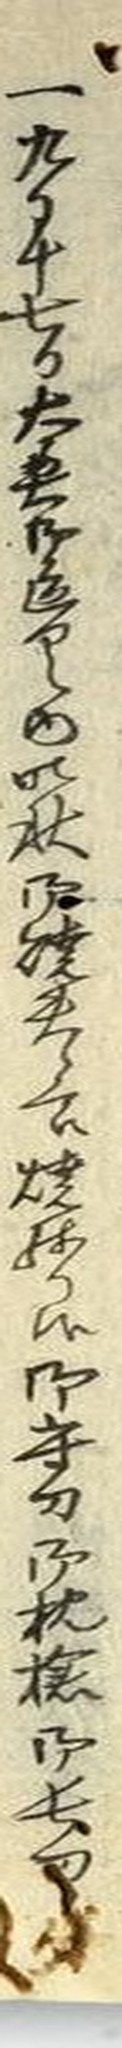一九月十七日大奥御道具之内昨秋御焼失之節焼残り候御守刀御枕槍御長刀
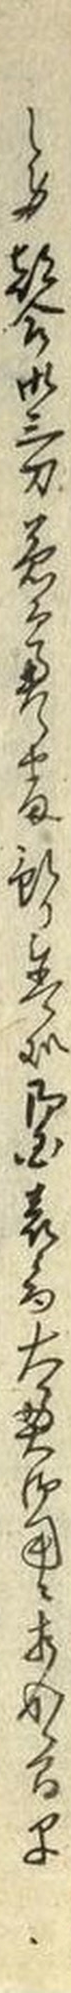之身都合御三刀兼而奥之番預り置候処御国表ニ而大奥御用ニ相成候間早
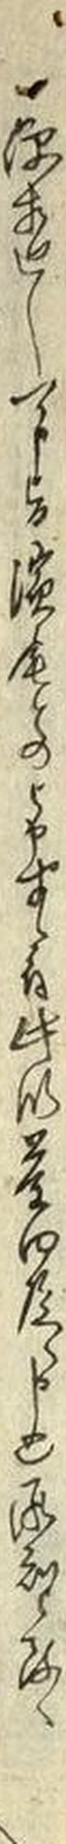便相廻し可申旨浜尾との被申聞候ニ付此段藤田殿へ申込承知被致候
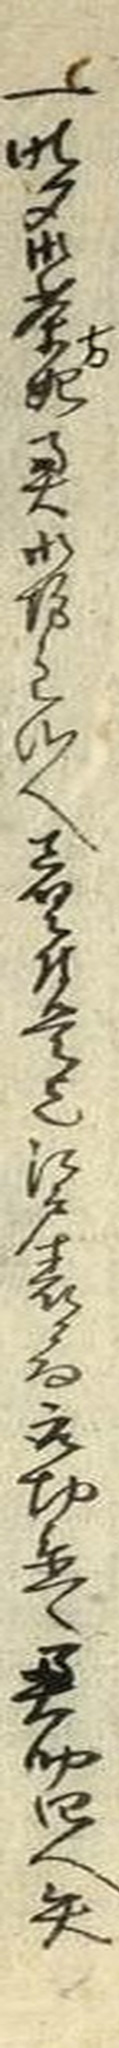一昨夕御茶方始奥御坊主弐人着ニ付是迄江戸表ニ而取切置候奥助四人矢
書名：少傅日録抄（斉善付側向頭取日記、江戸并道中、初入在国、逝去後…
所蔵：福井県文書館 Fukui Prefectural Archives
